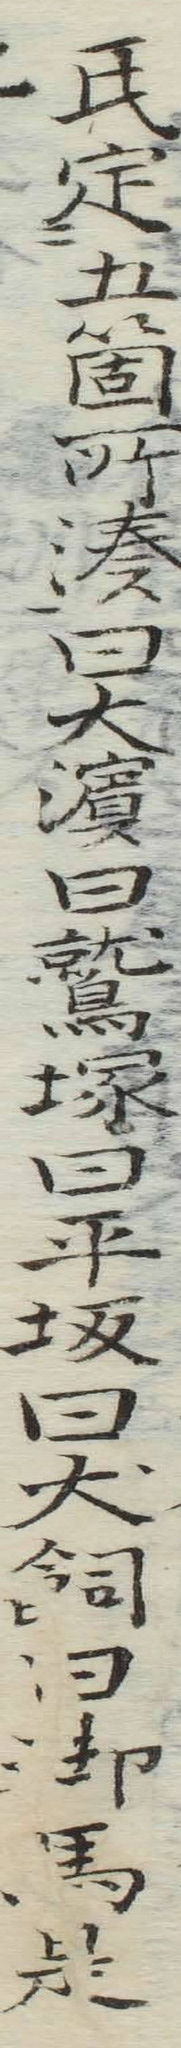氏定五箇所湊曰大浜曰鷲塚曰平坂曰犬飼曰御馬是
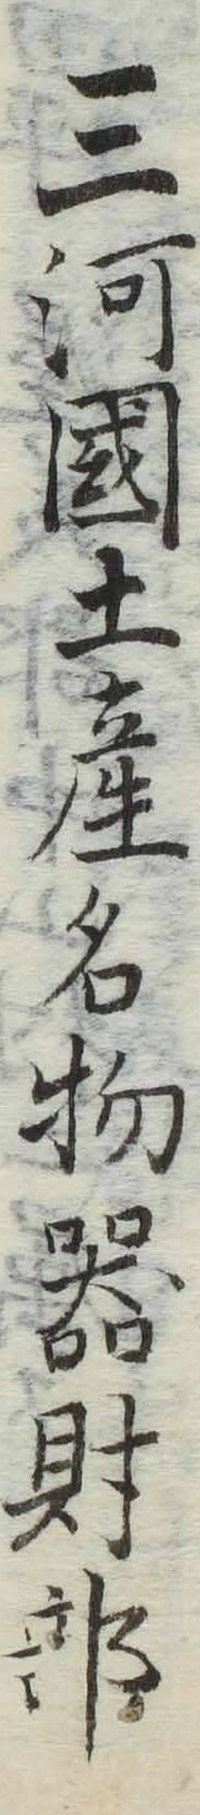三河国土産名物器財部
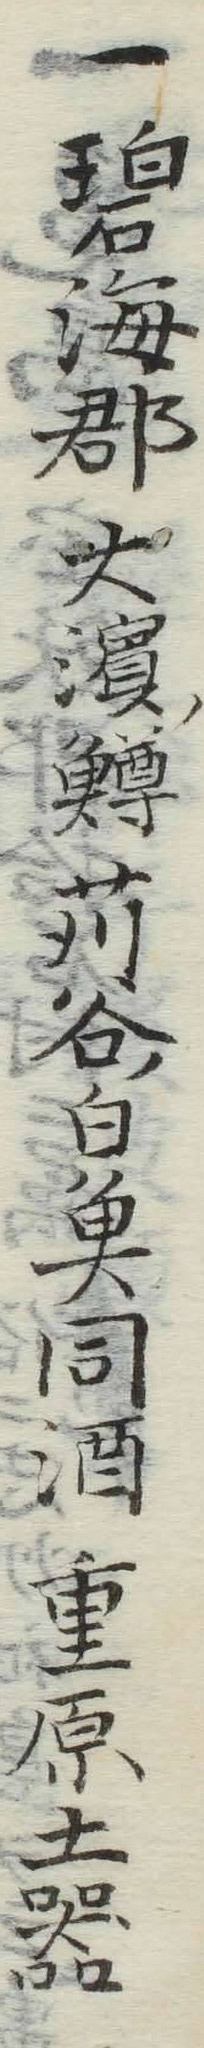一碧海郡大浜鱒刈谷魚同酒重原土器
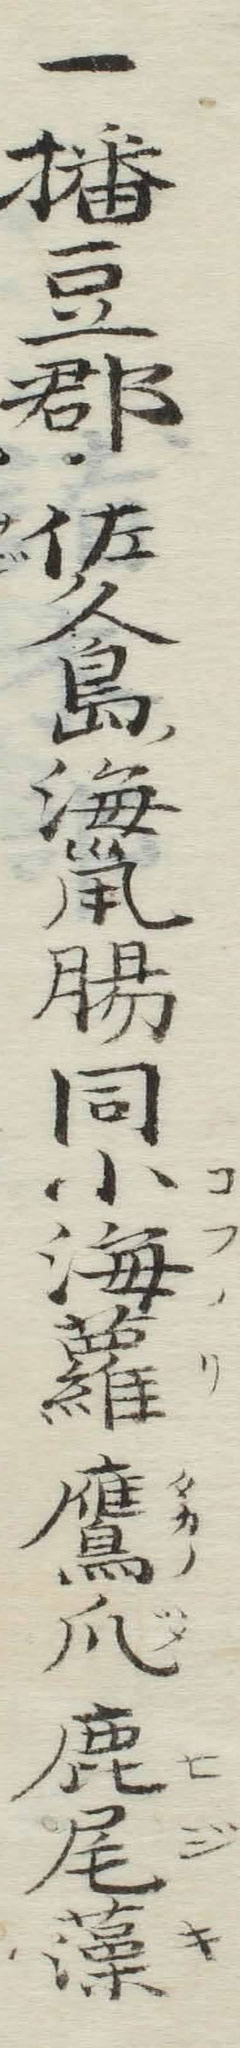一播豆郡佐久島海鼠腸同小海蘿高爪鹿尾藻
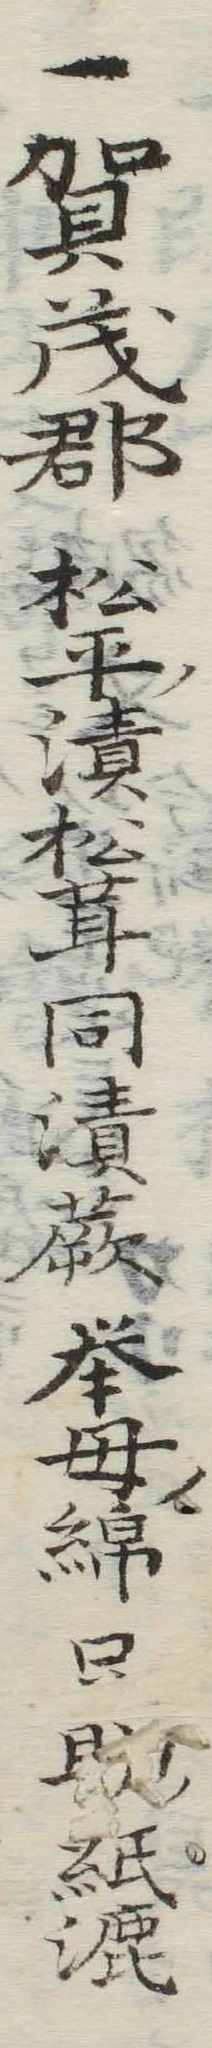一加茂郡松平漬松茸同漬蕨挙母綿足助紙漉
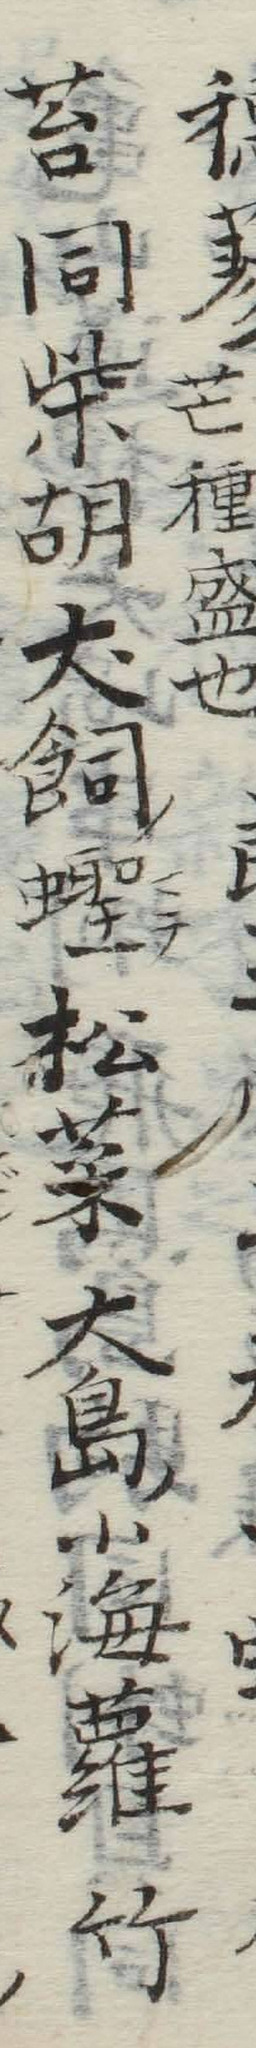苔同柴胡犬飼蟶松菜大島小海蘿竹
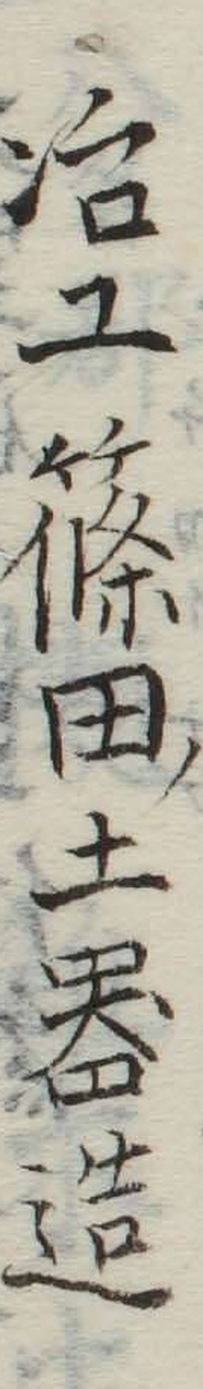冶工篠田土器造

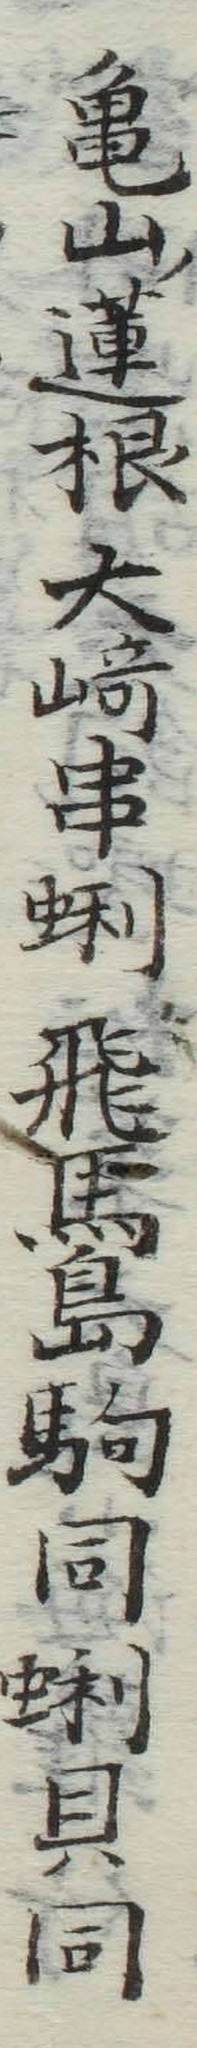亀山蓮根大崎串蜊飛馬島駒同蜊貝同
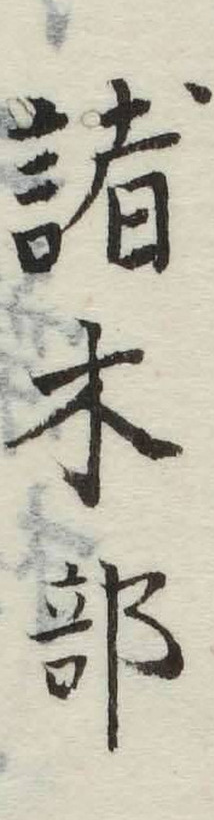諸木部
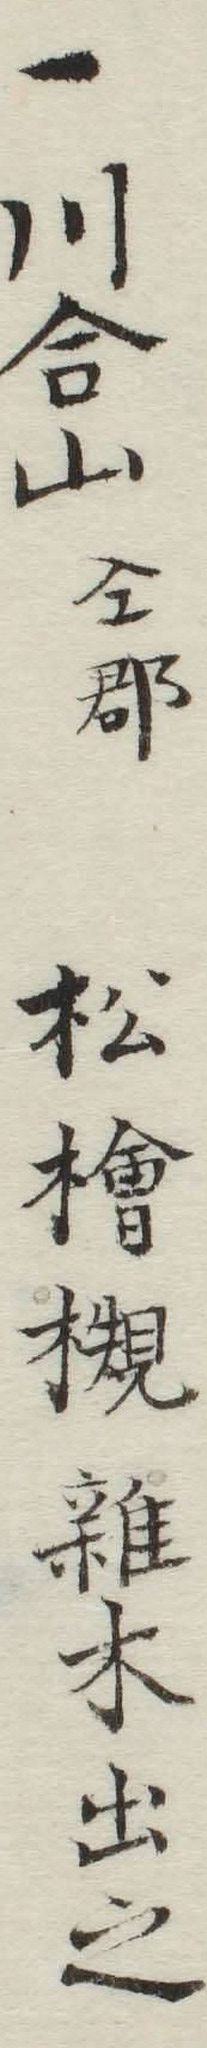一川合山同郡松桧槻雑木出之
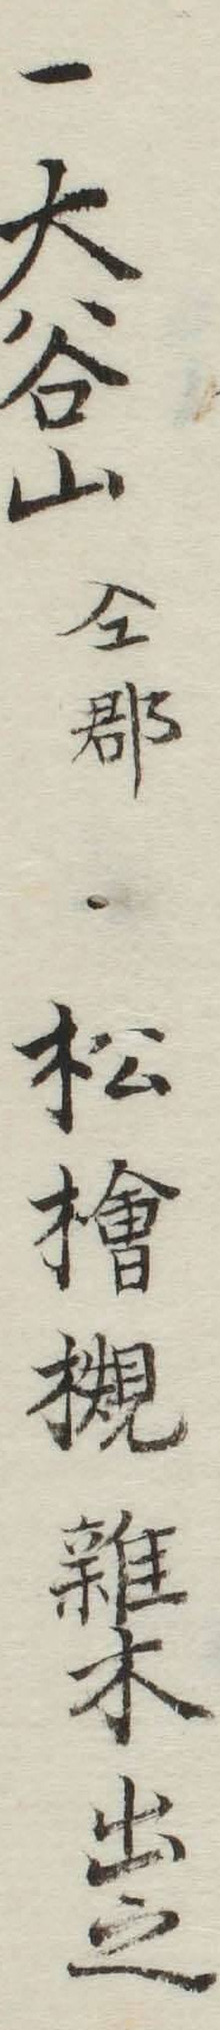一大谷山同郡松桧槻雑木出之
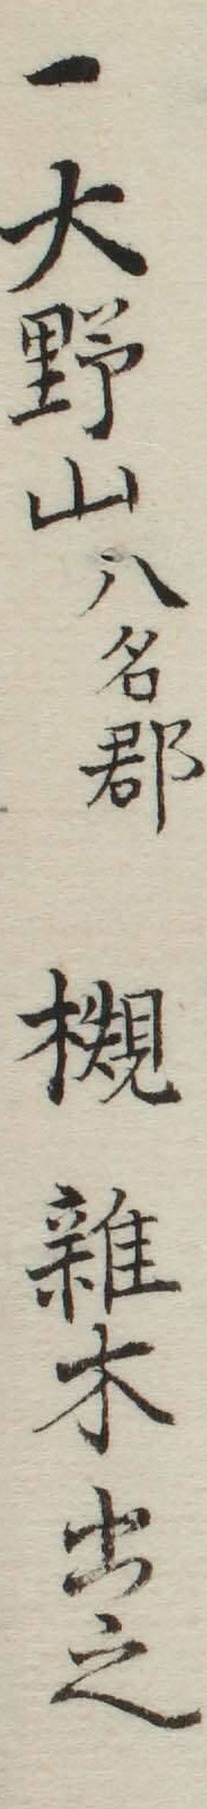一大野山八名郡槻雑木出之

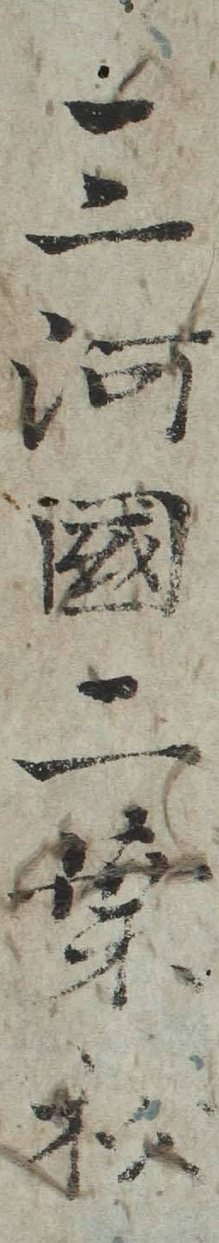三河国二葉松

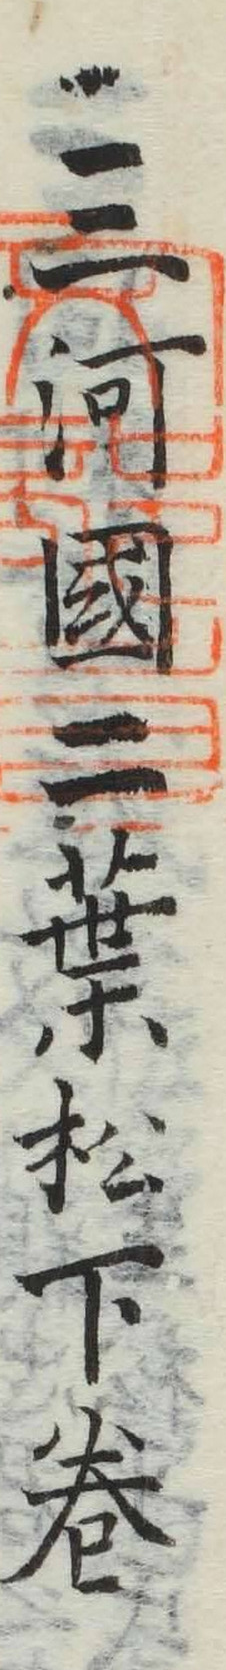三河国二葉松下巻
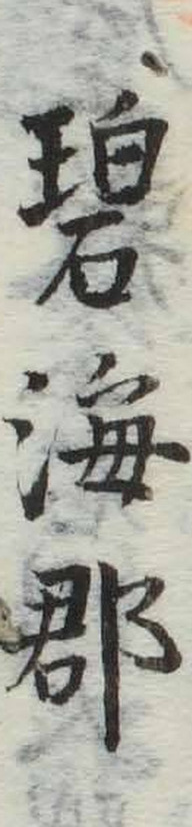碧海郡

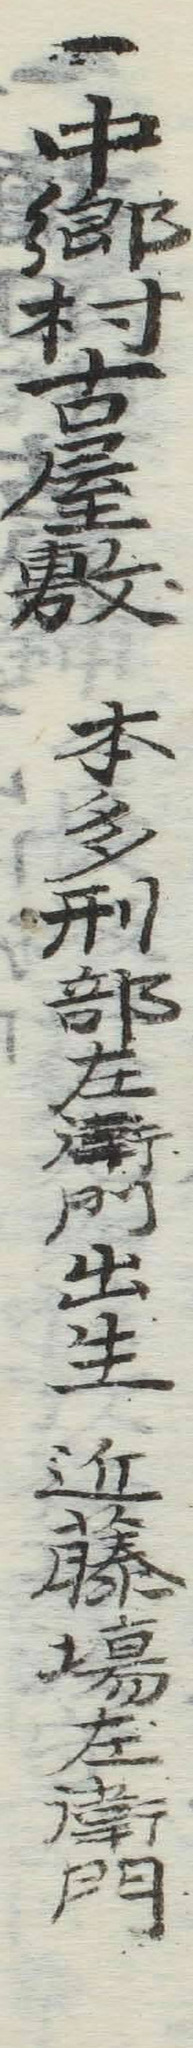一中郷村古屋敷本多刑部左衛門出生近藤場左衛門
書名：三河国二葉松
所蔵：国文学研究資料館
